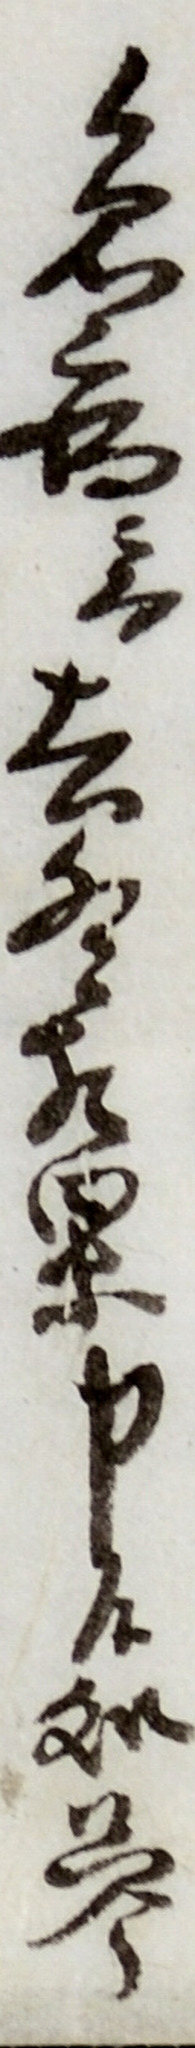急病にて去冬相果申候処只今
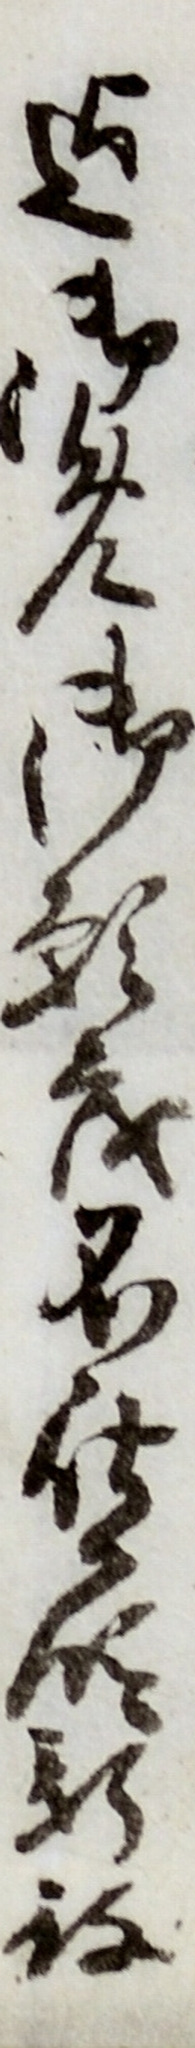迄御免御願も不仕候段新役
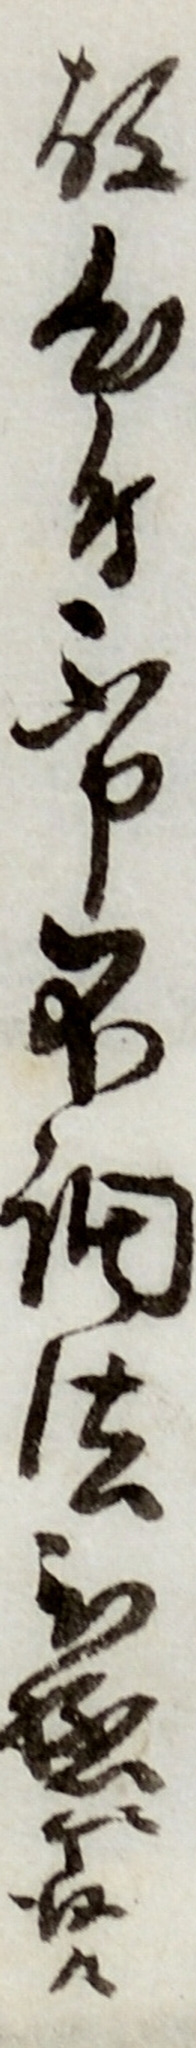故心付不申不調法至極ニ奉存候
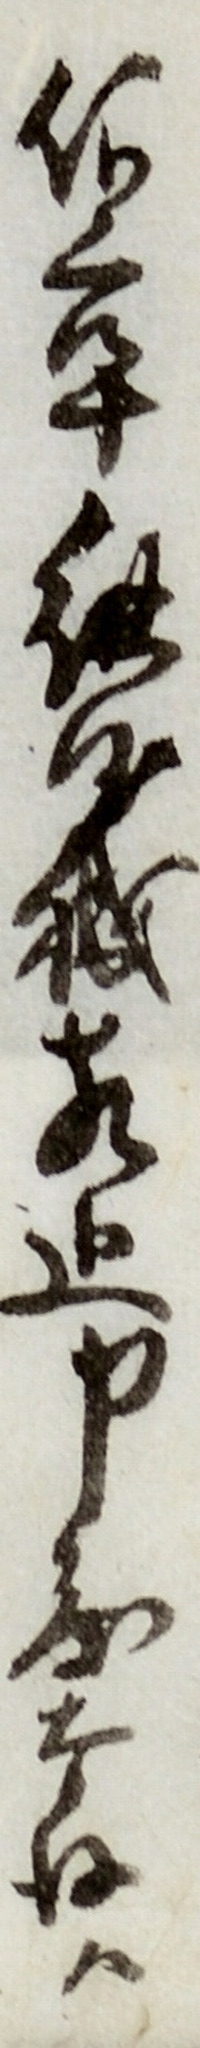何卒紺屋職相止申度奉存候
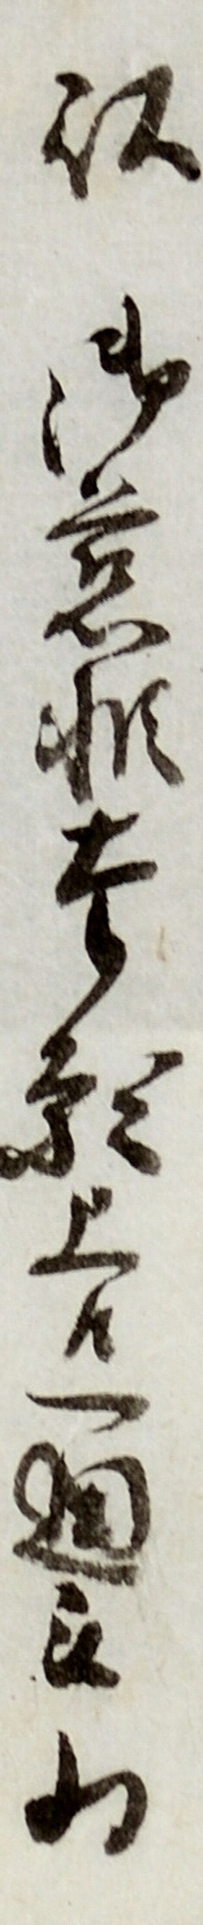以御慈悲奉願上候通被為
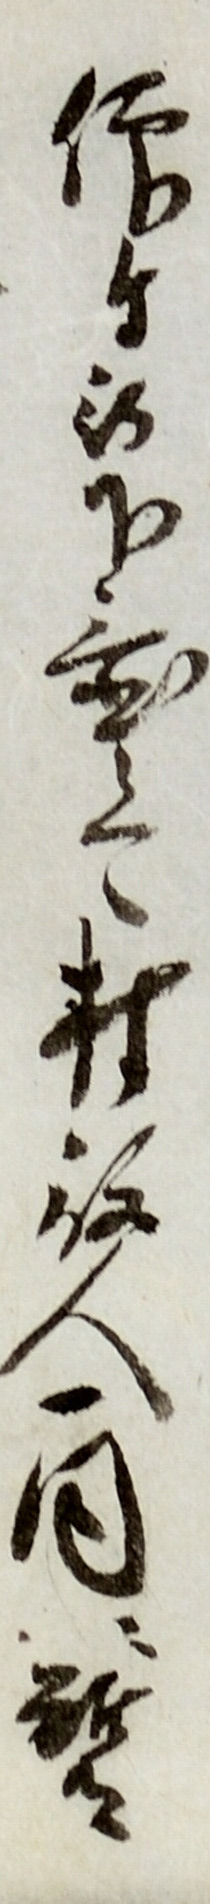仰付被下置候はゝ村役人一同に難有
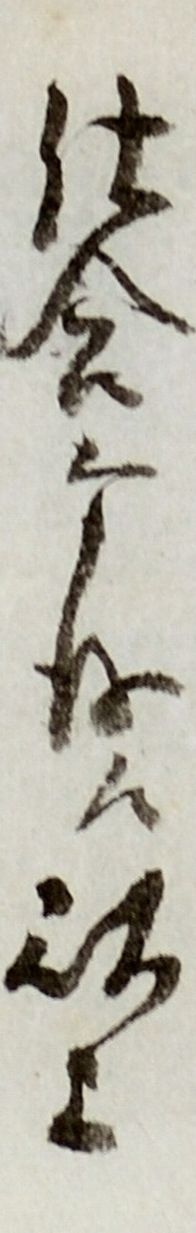仕合奉存候以上
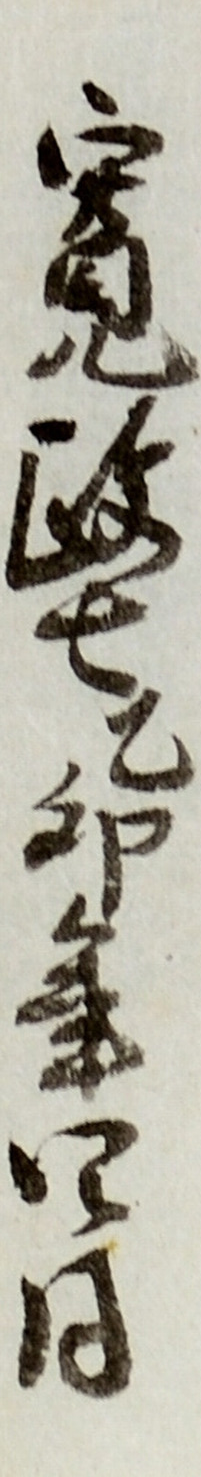寛政七己卯年四月
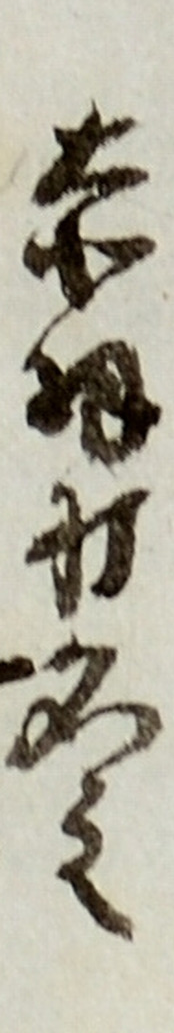赤羽村名主
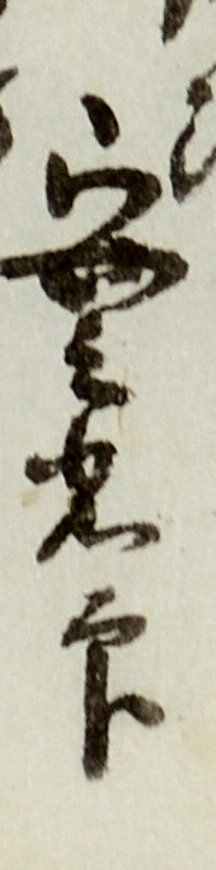安兵衛印
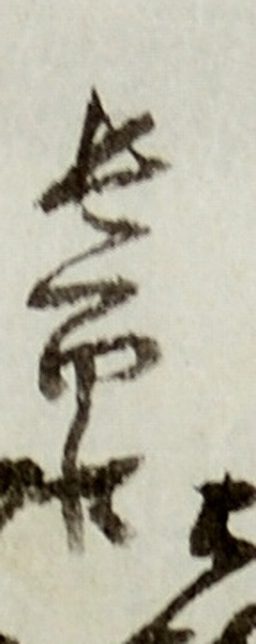長百性
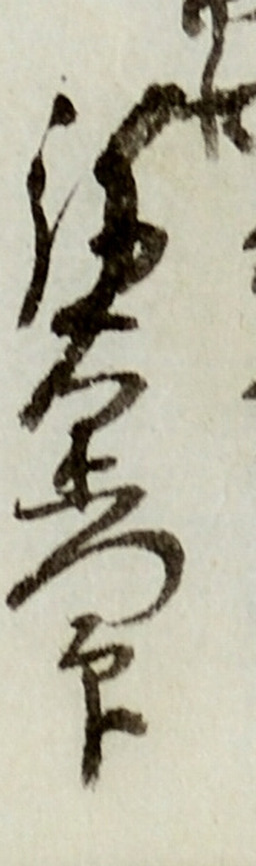弥右衛門印
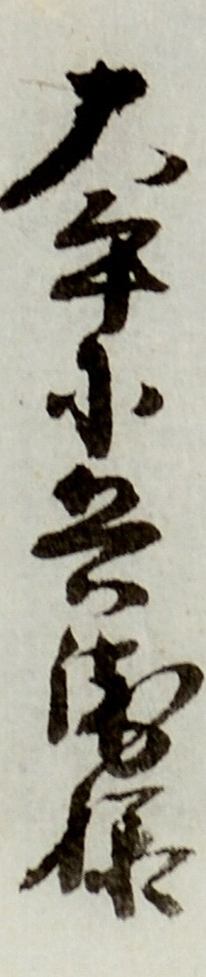大平小兵衛様
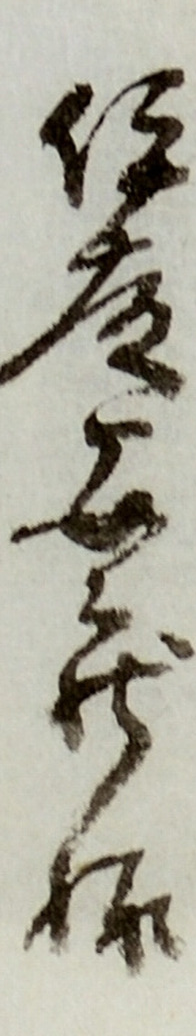伊藤安蔵様
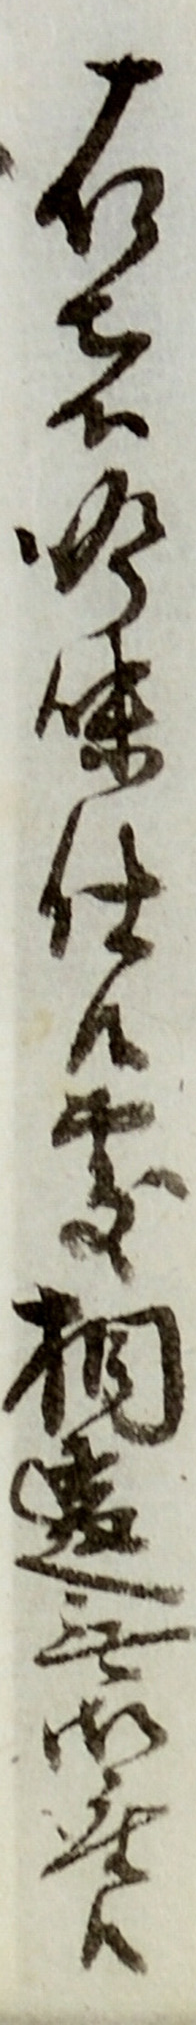右は吟味仕候処相違無御座候
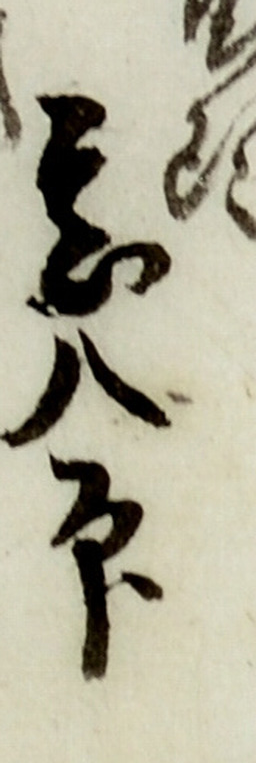甚八印
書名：諸事御用留帳
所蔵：伊那市立高遠町図書館・合同会社AMANE
